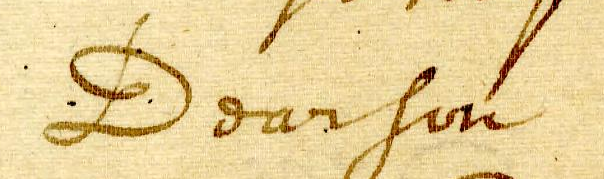Dear Son
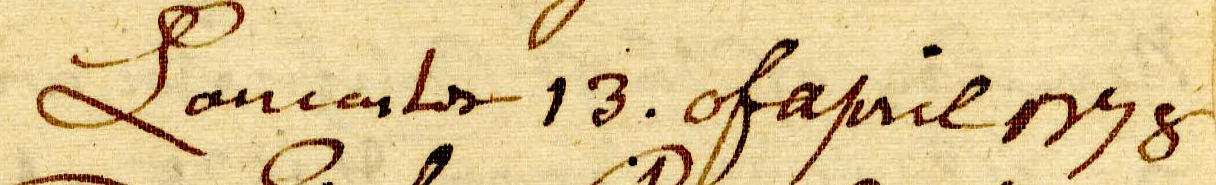Lancaster 13. of April 1778
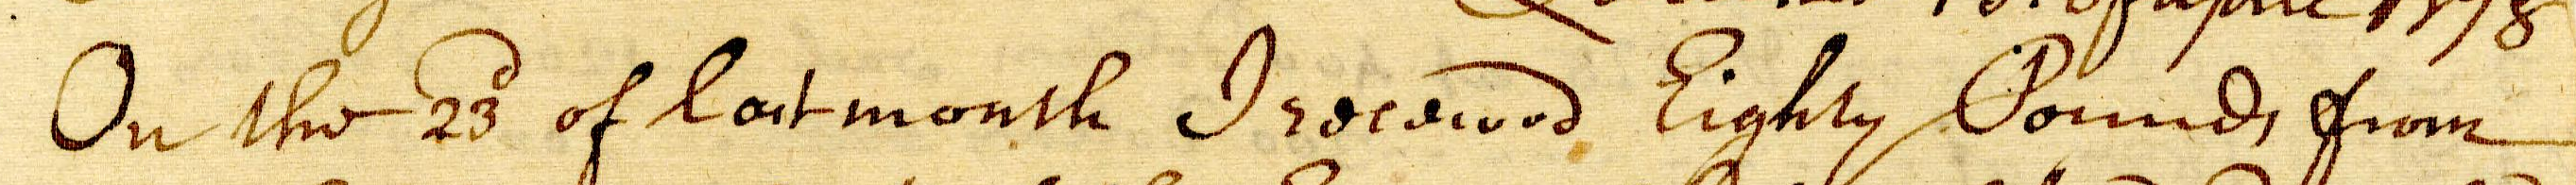On the 23^d of last month I received Eighty Pounds from
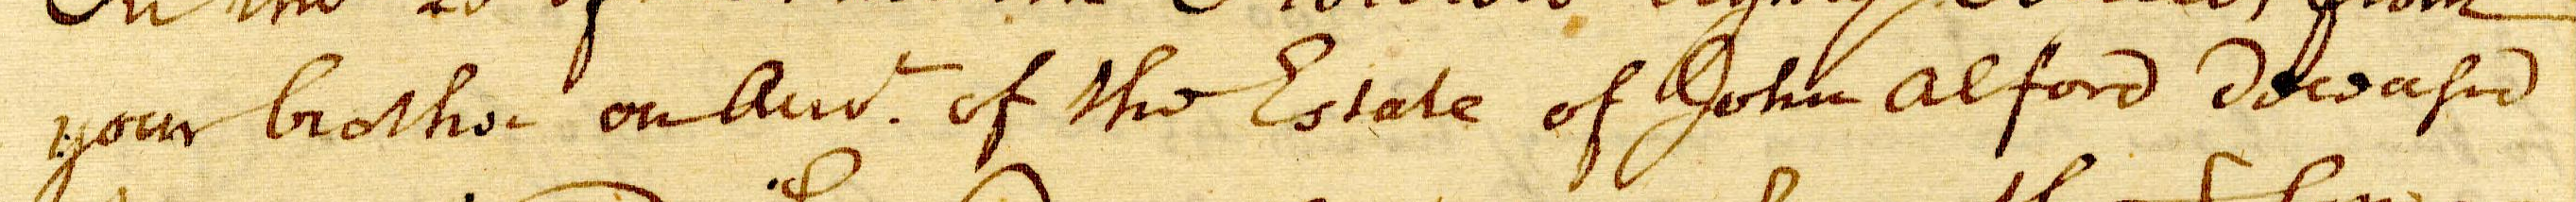your brother on Acco^t. of the Estate of John Alford deceased
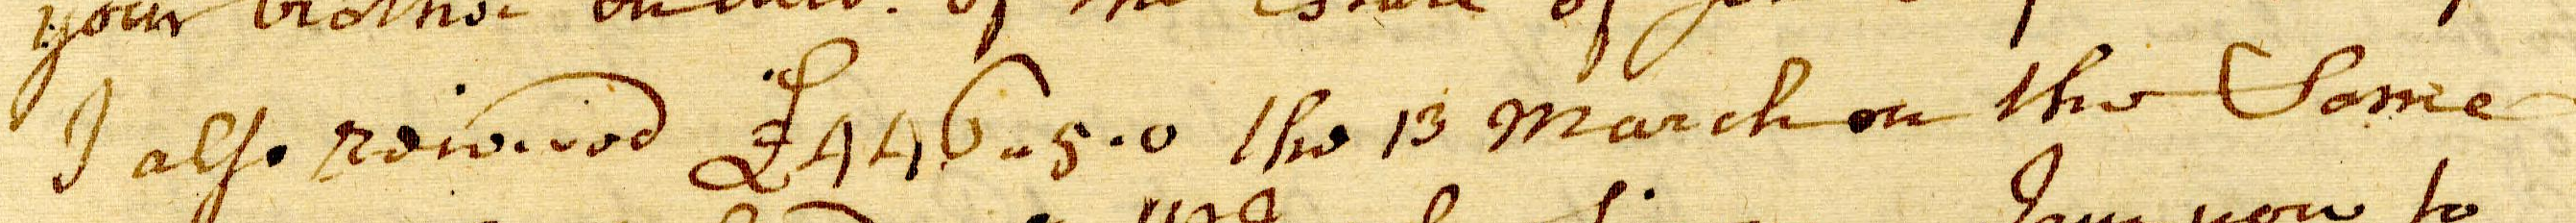I also received £446..5.0 the 13 March on the Some
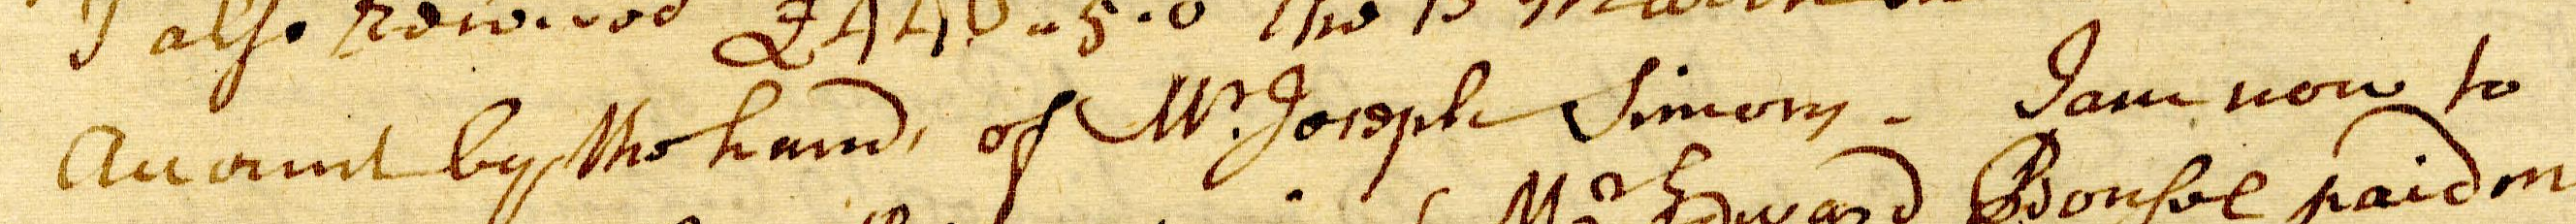Account by the hands of M^r. Joseph Simons. I am now to
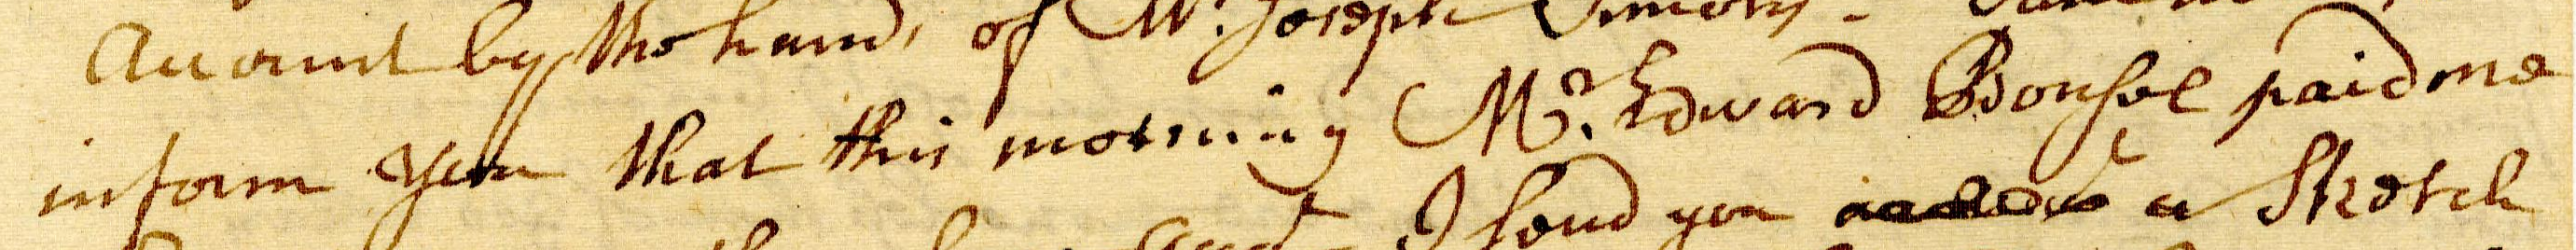inform You that this morning M^r. Edward Bonsel paid me
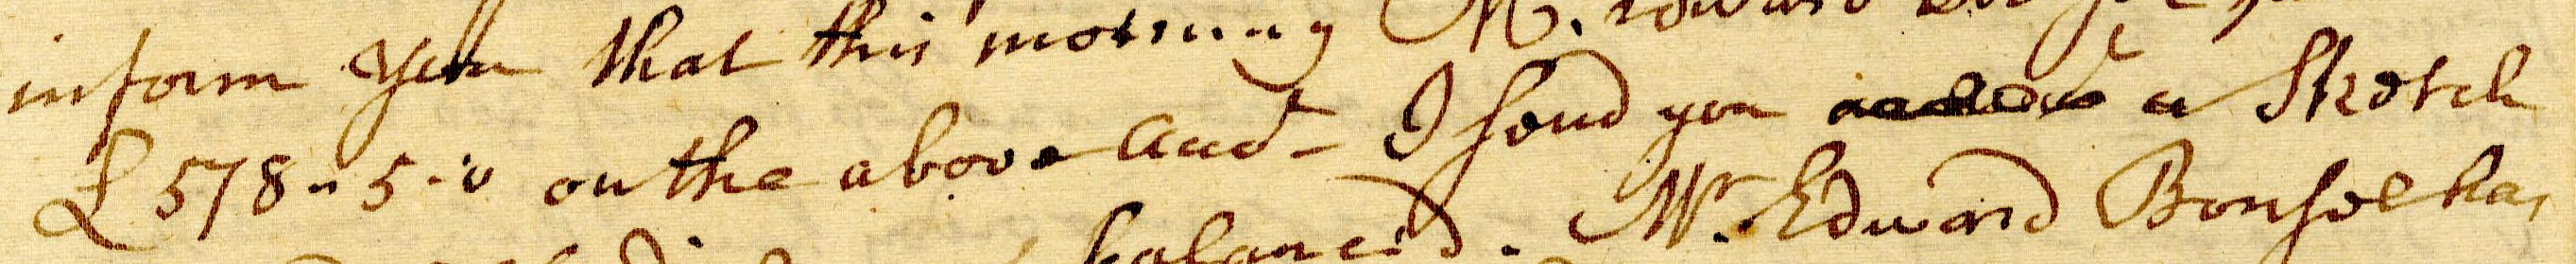£578..5.0 on the above Accc^t- I send you [_____] a Sketch
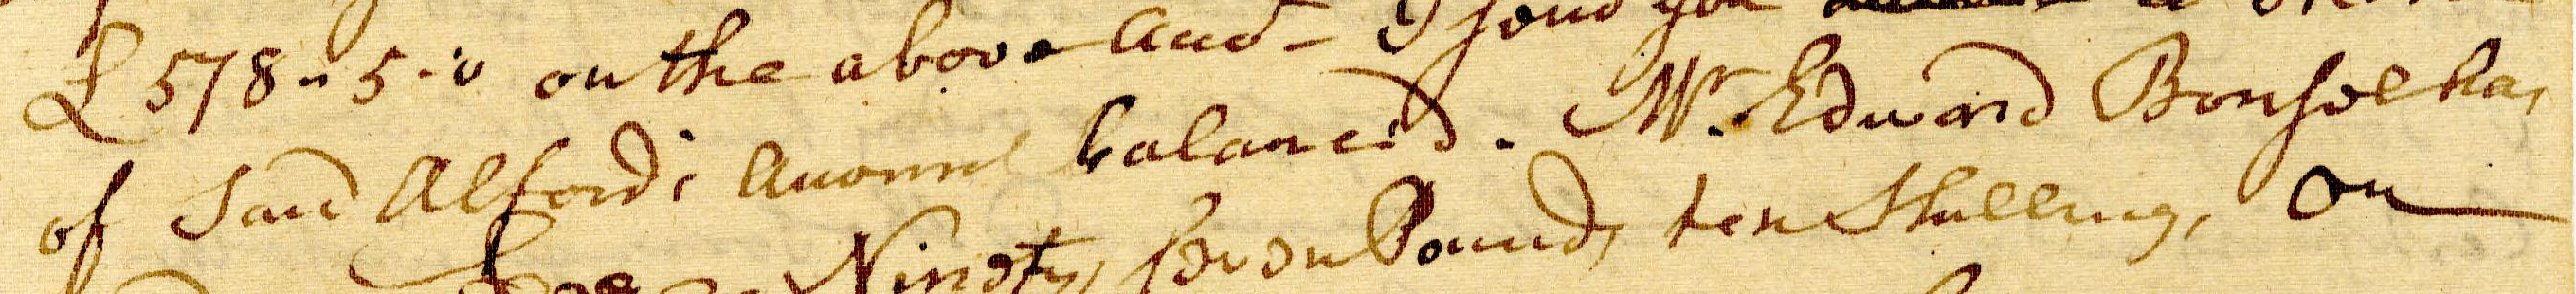of Said Alford's Account balanced. M^r. Edward Bonsel has
